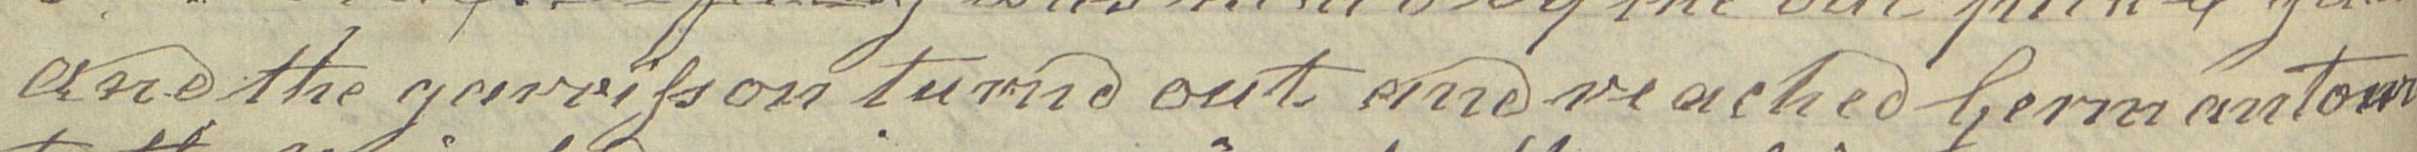and the garrison turnd out and reached Germantown
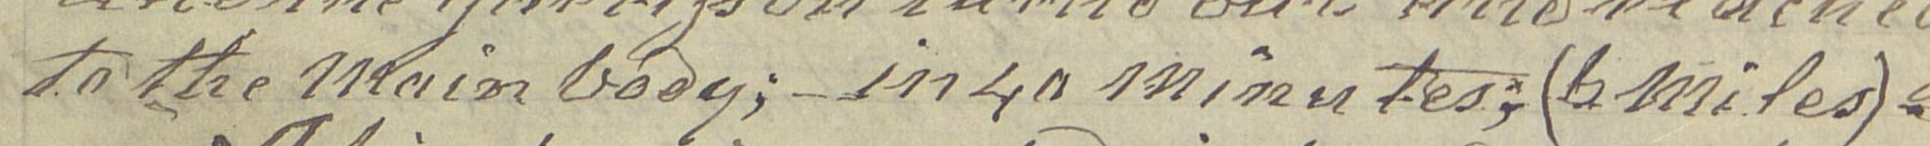to the Main body; in 40 minutes; (8 Miles)
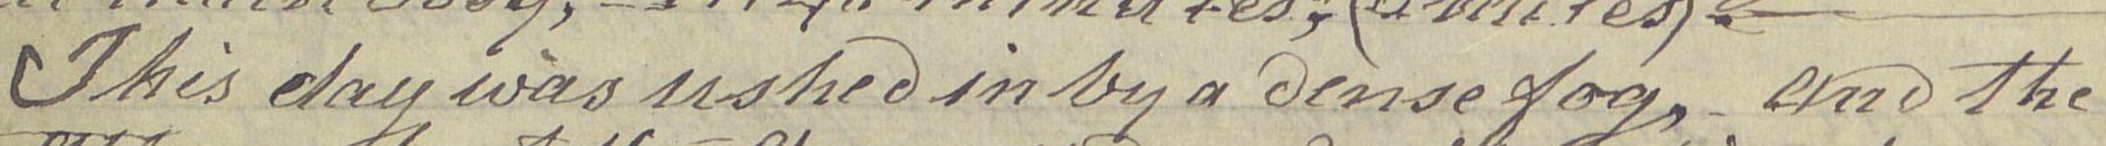This day was ushed in by a dense fog, and the
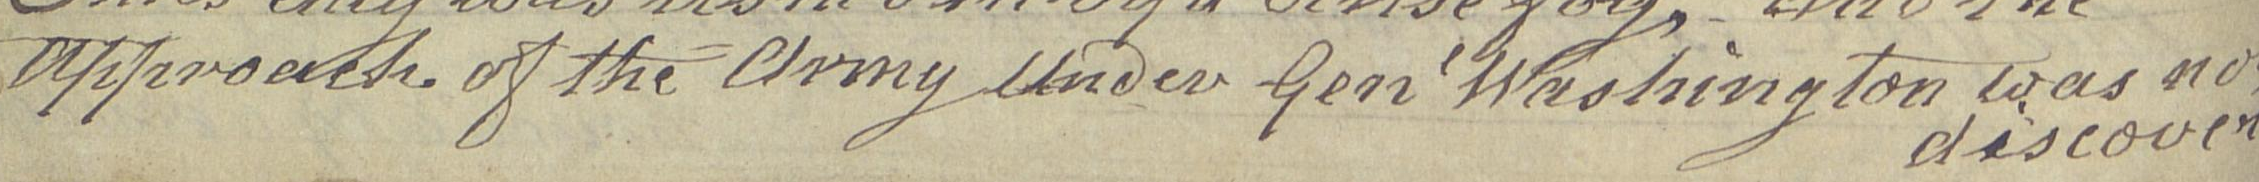Approach of the Army Under Gen^l Washington was not
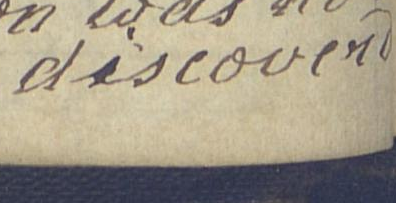discoverd
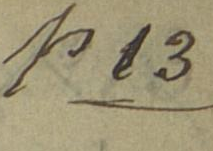p 13
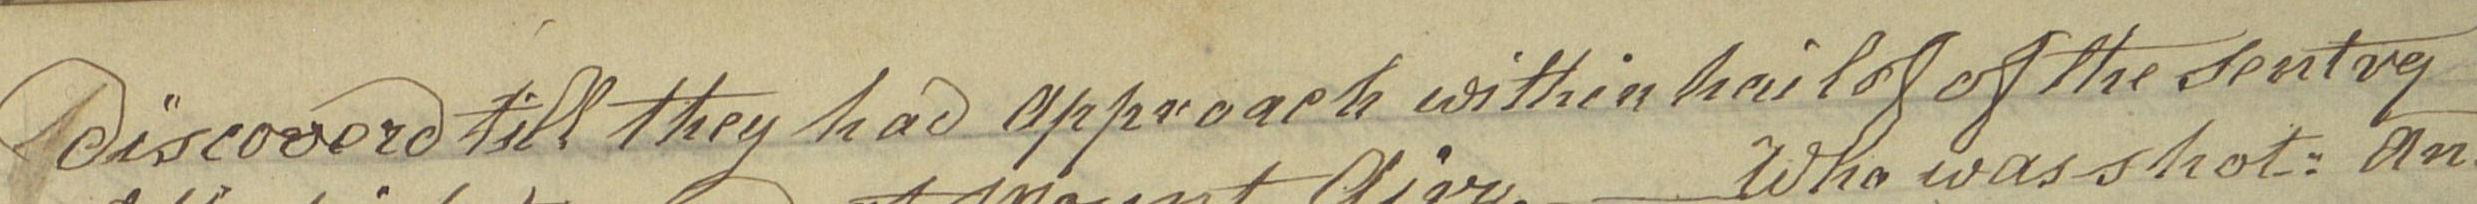discoverd till they had approach within hail of of the sentry
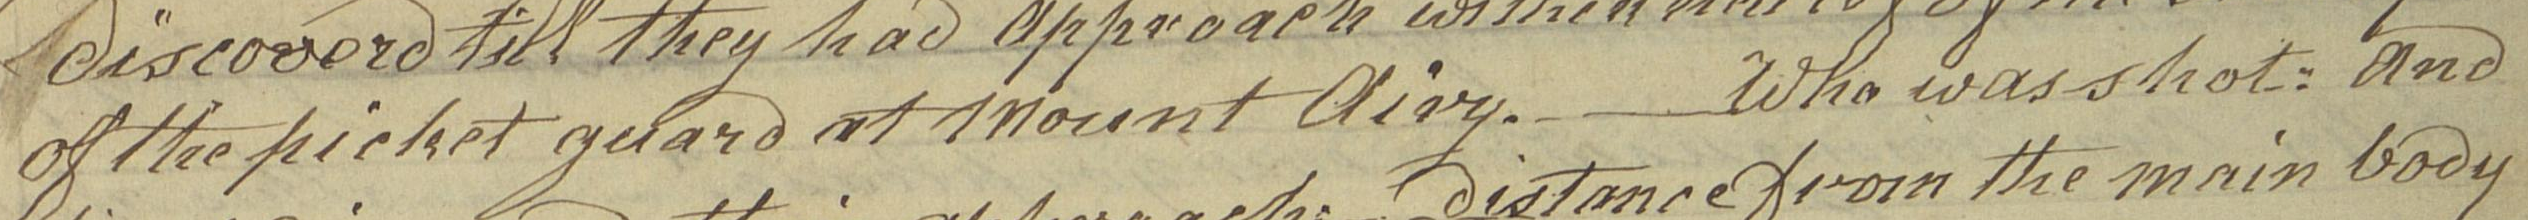of the picket guard at Mount Airy. Who was shot: And
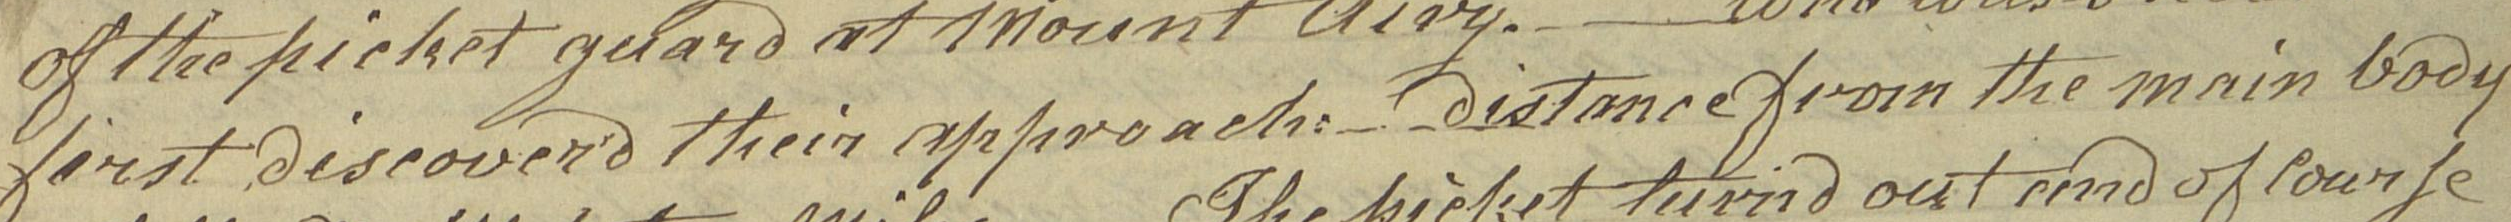first discoverd their approach. distance from the main body
